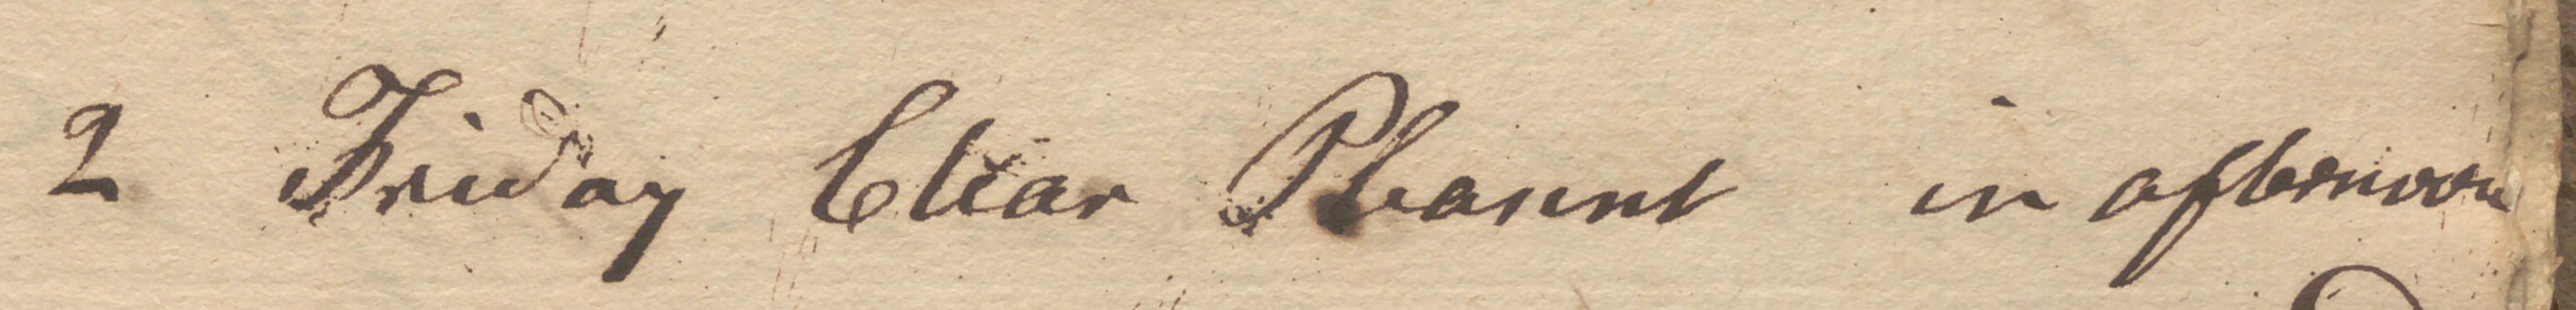2 Friday Clear Pleasent, in afternoon
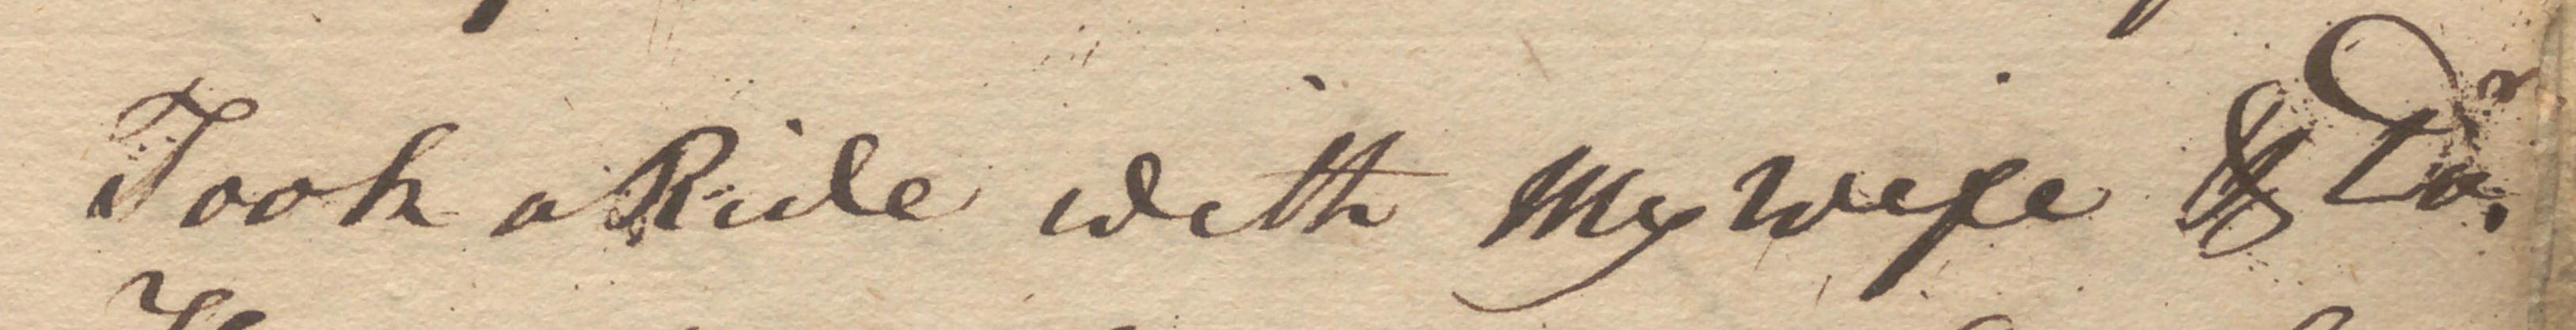Took a Ride with My wife & Da^r.
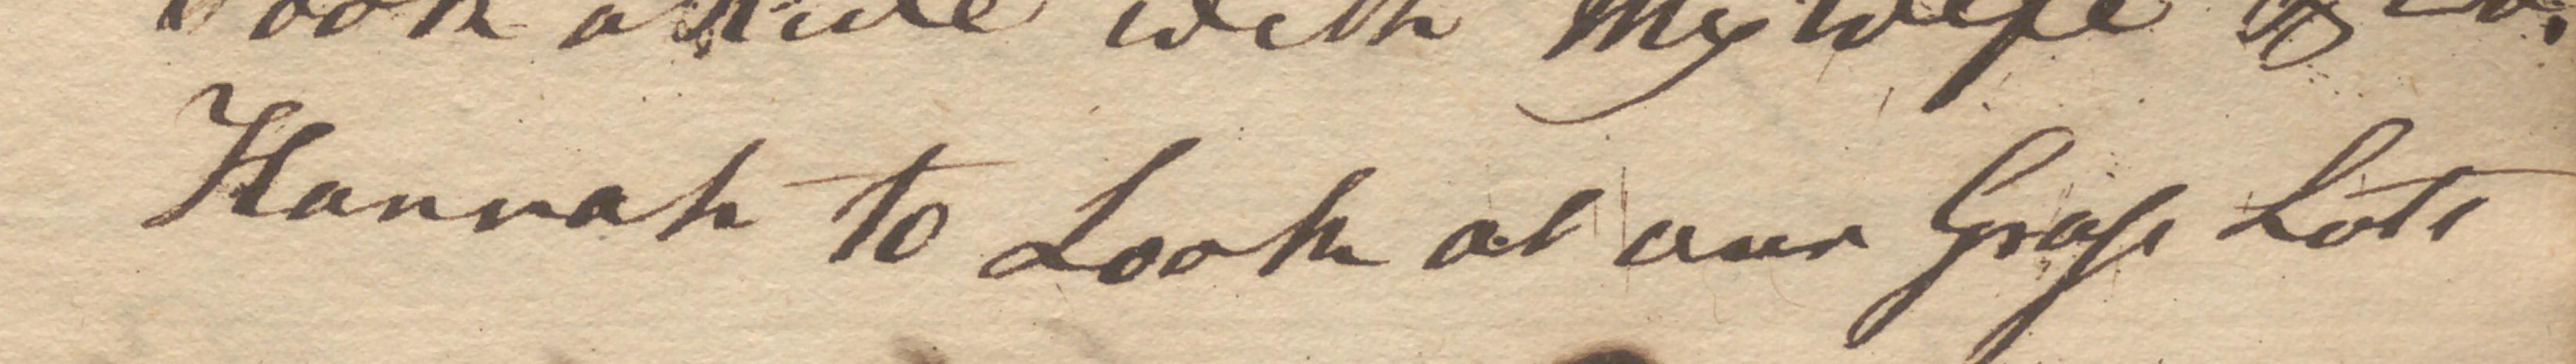Hannah to Look at our Grass Lots
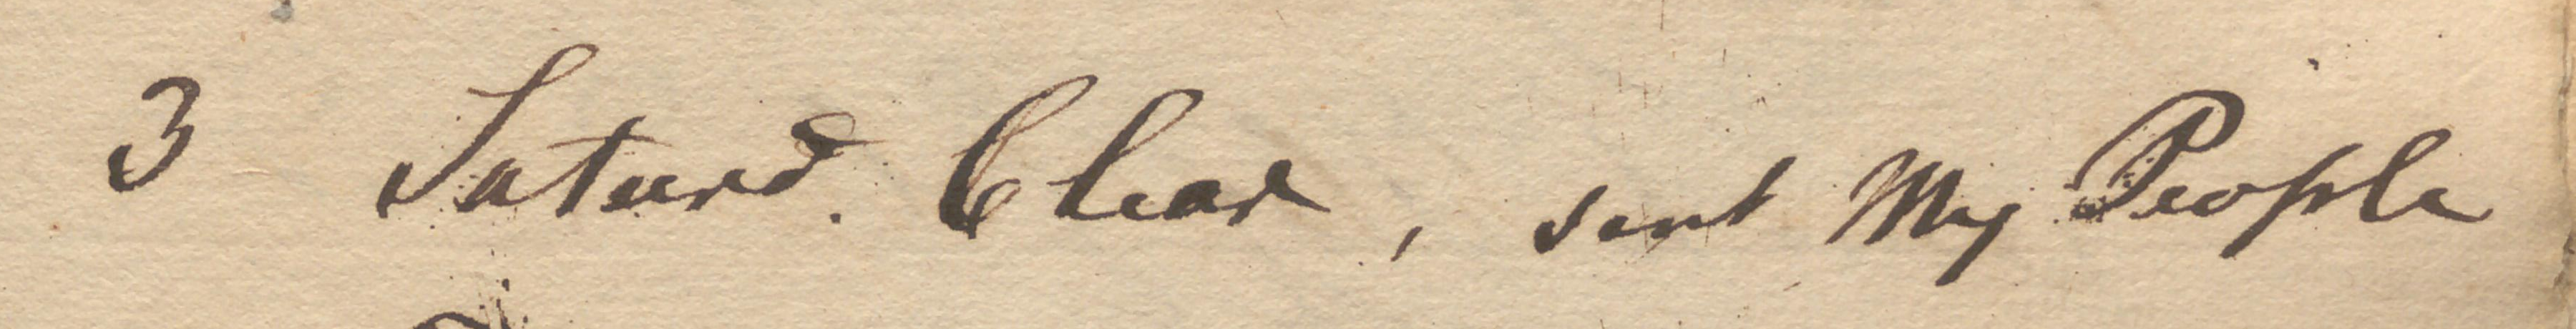3 Saturd, Clear, sent My People
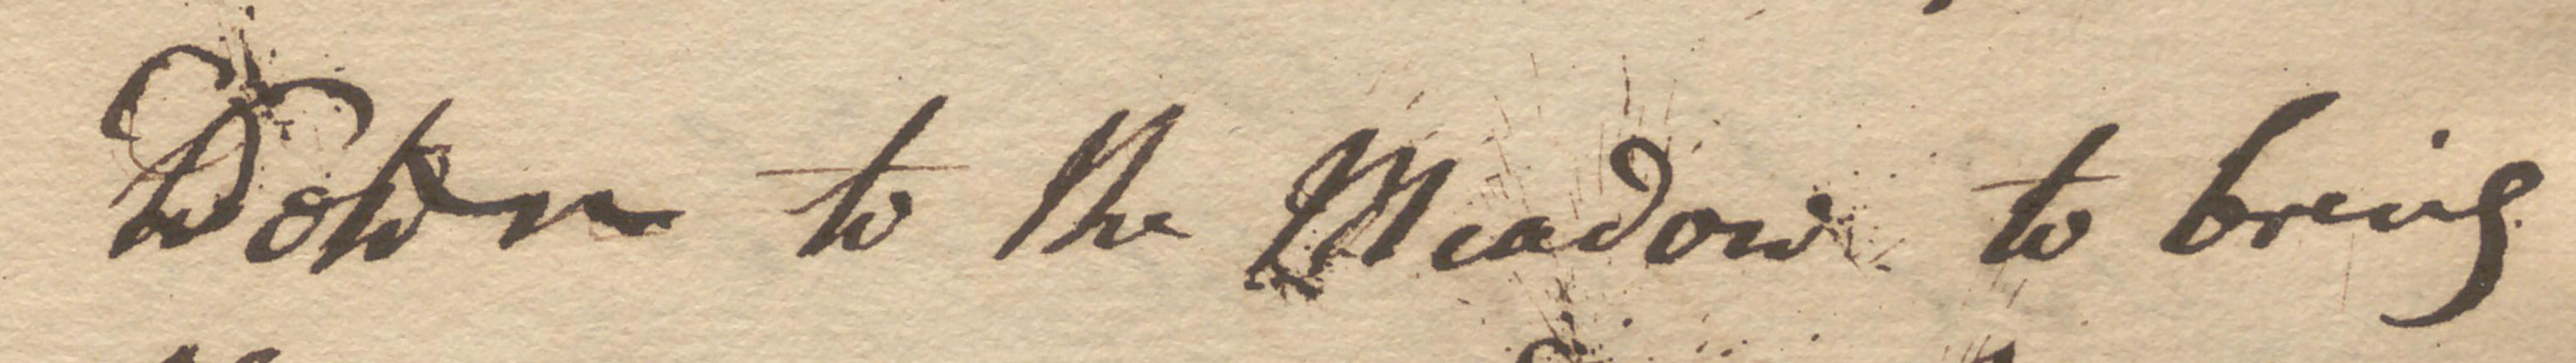Down to the Meadow to bring
